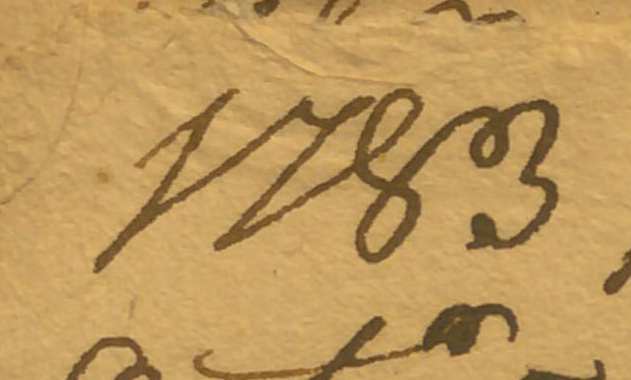1783
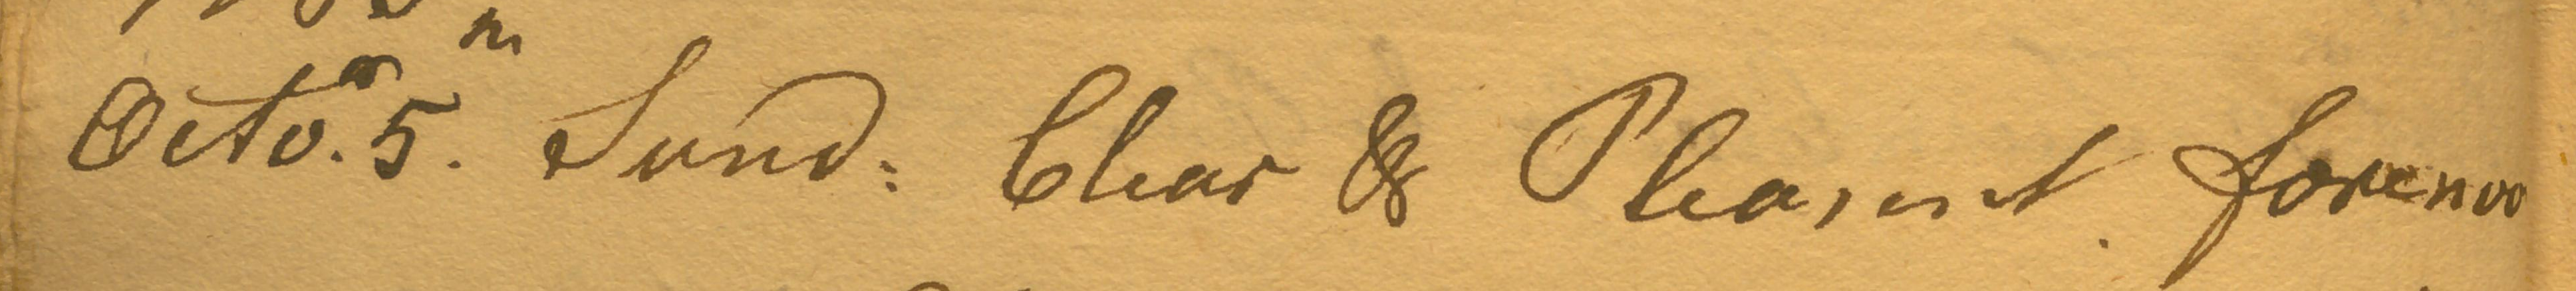Octo^r. 5^th. Sund: Clear & Pleasent forenoon
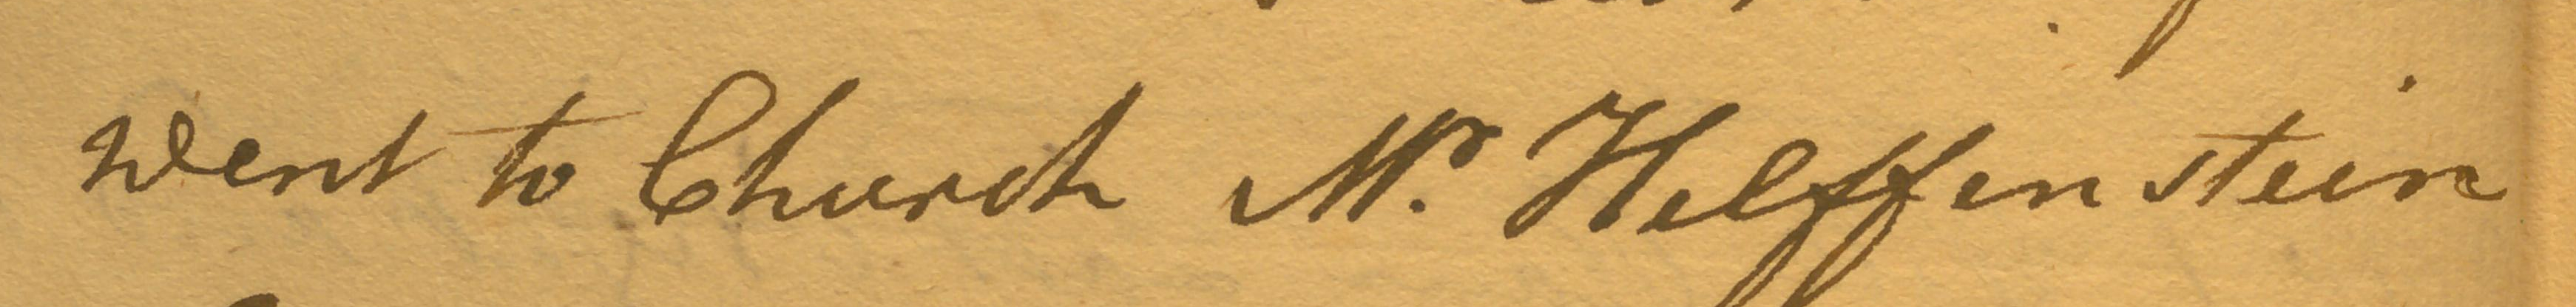went to Church M^r. Helffenstein
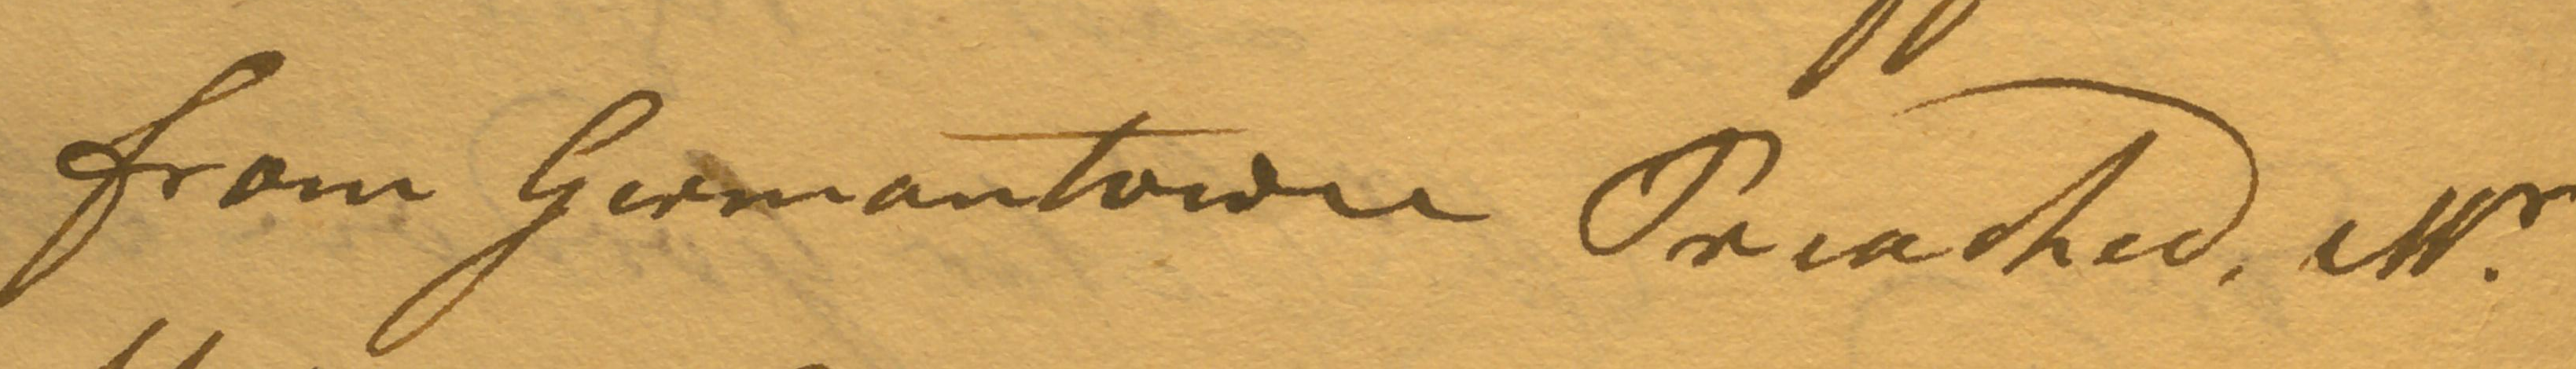from Germantown Preached, M^r
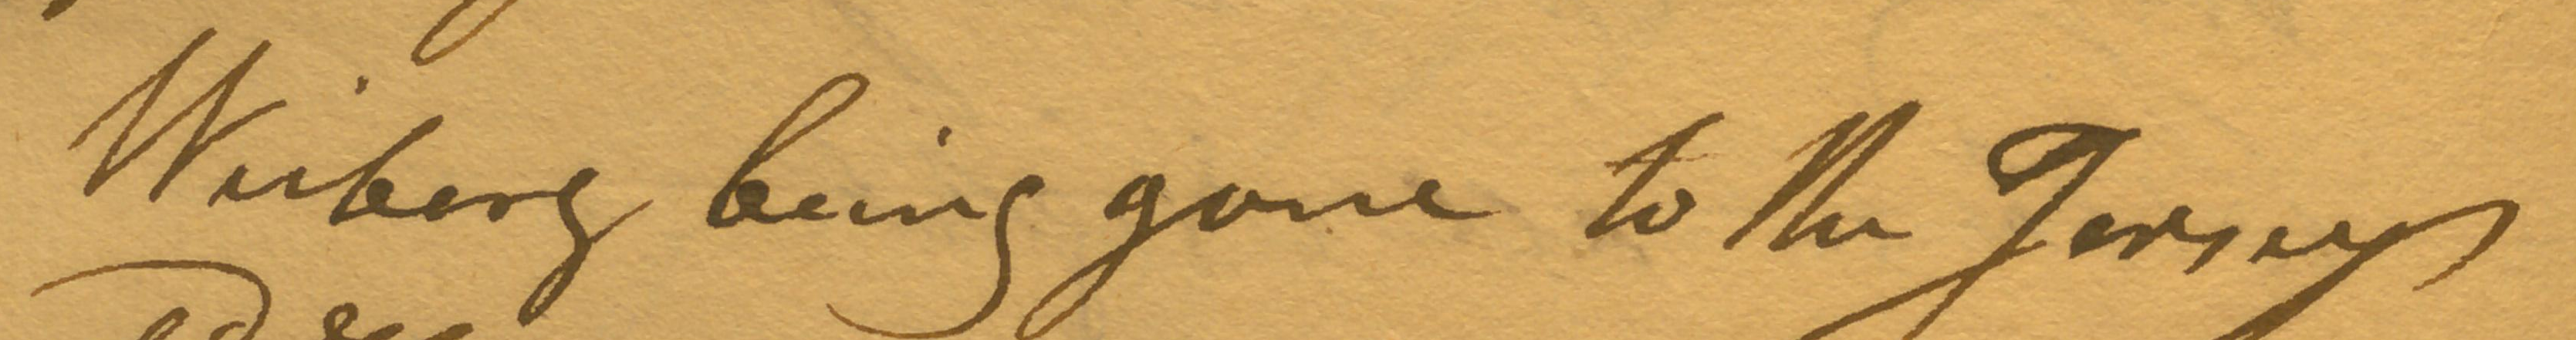Weiberg being gone to the Jerseys
